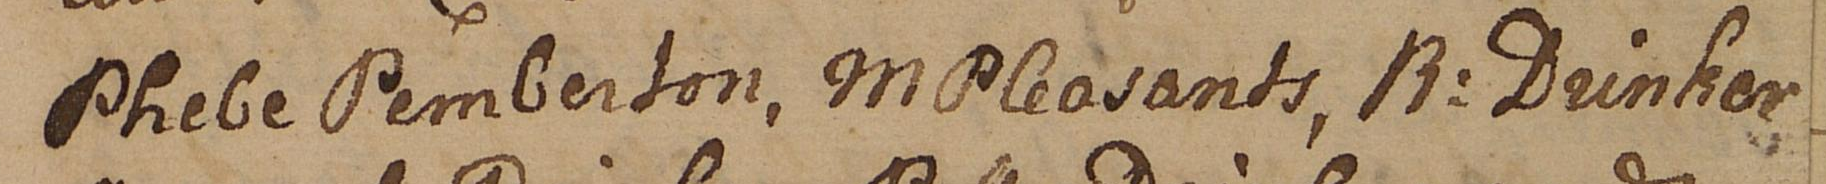Phebe Pemberton, M Pleasants, R: Dunker
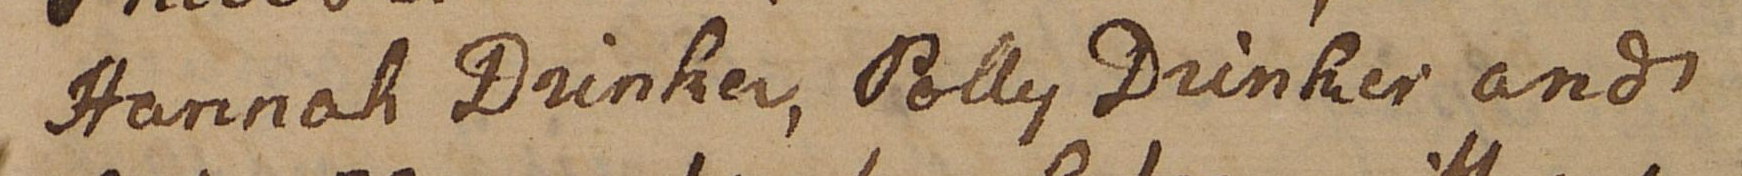Hannah Drinker, Polly Drinker and
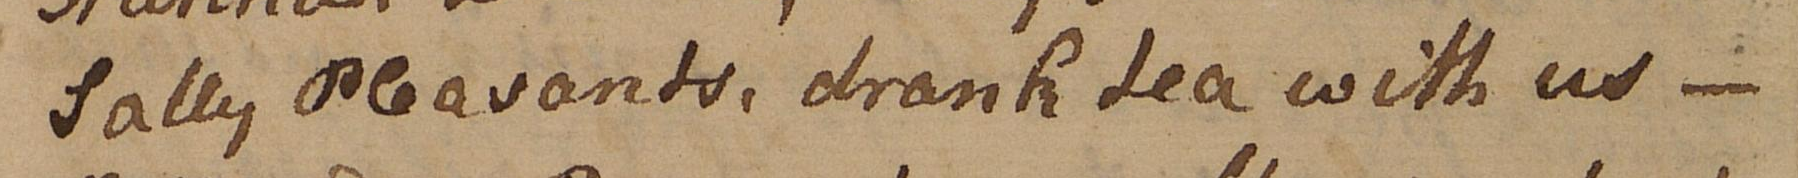Sally Pleasants, drank tea with us-
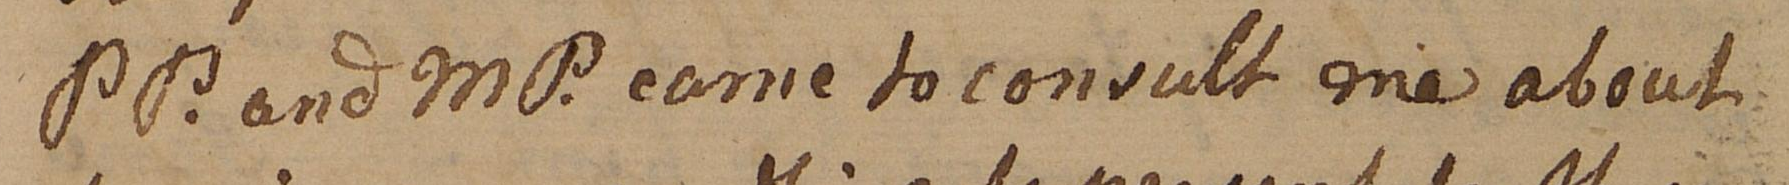P P. and MP. came to consult me about
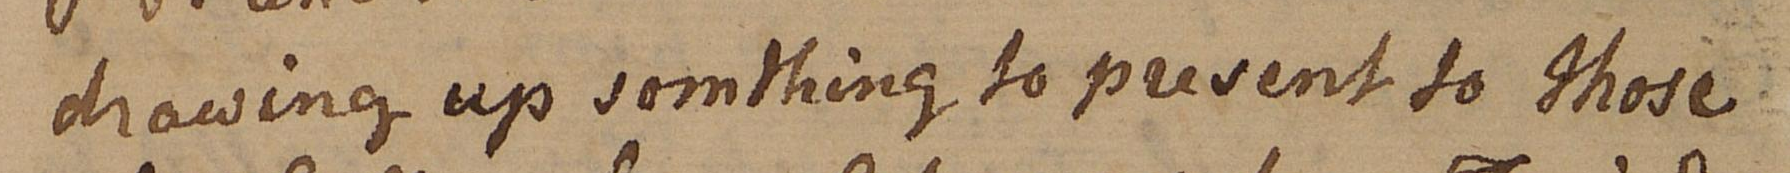drawing up somthing to present to those
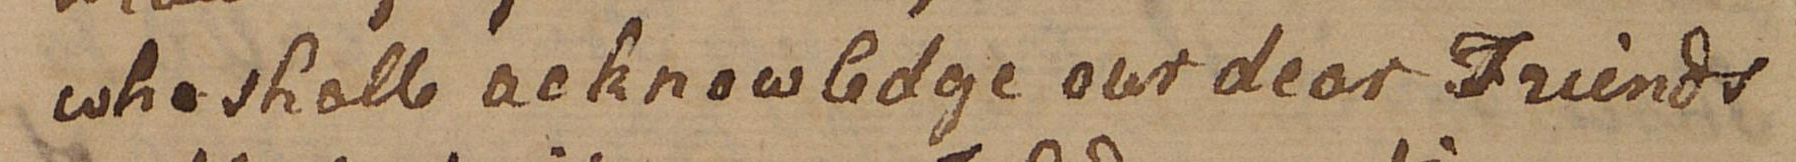who shall acknowledge our dear Friends
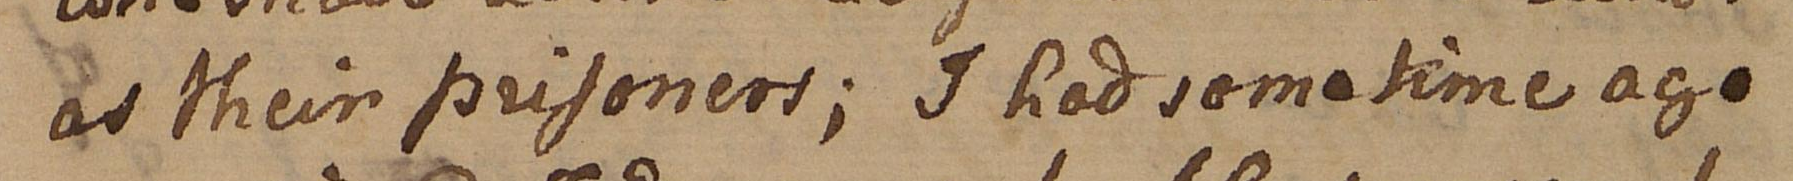as their prisoners; I had sometime ago
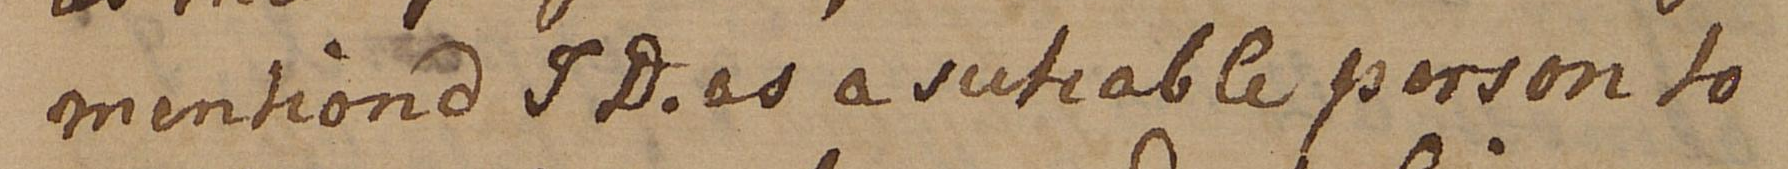mentiond JD. as a sutiable person to
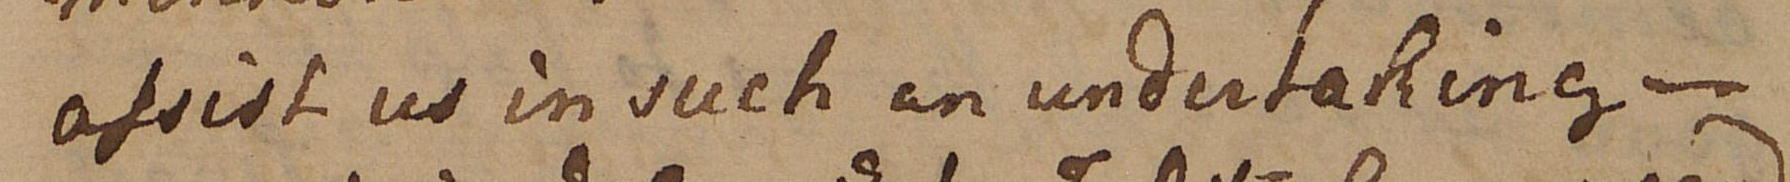assist us in such an undertaking-
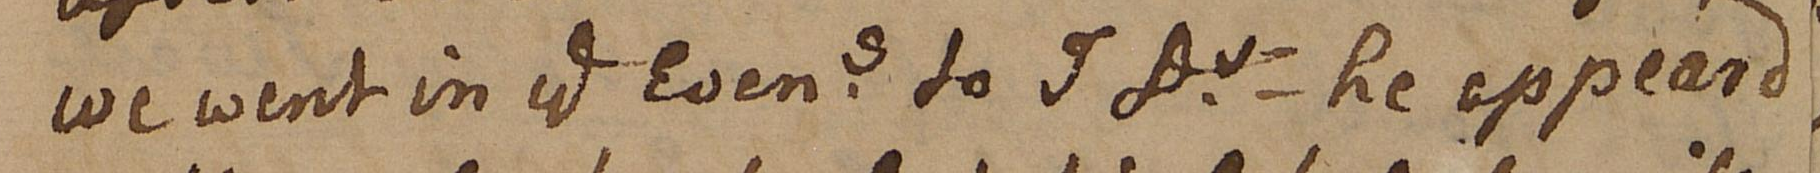we went in y^ Even^g. to J D^r.- he appeard
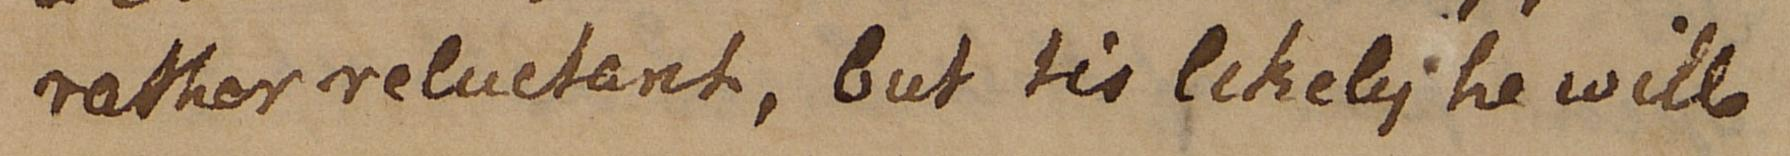rather reluctant, but tis likely he will
